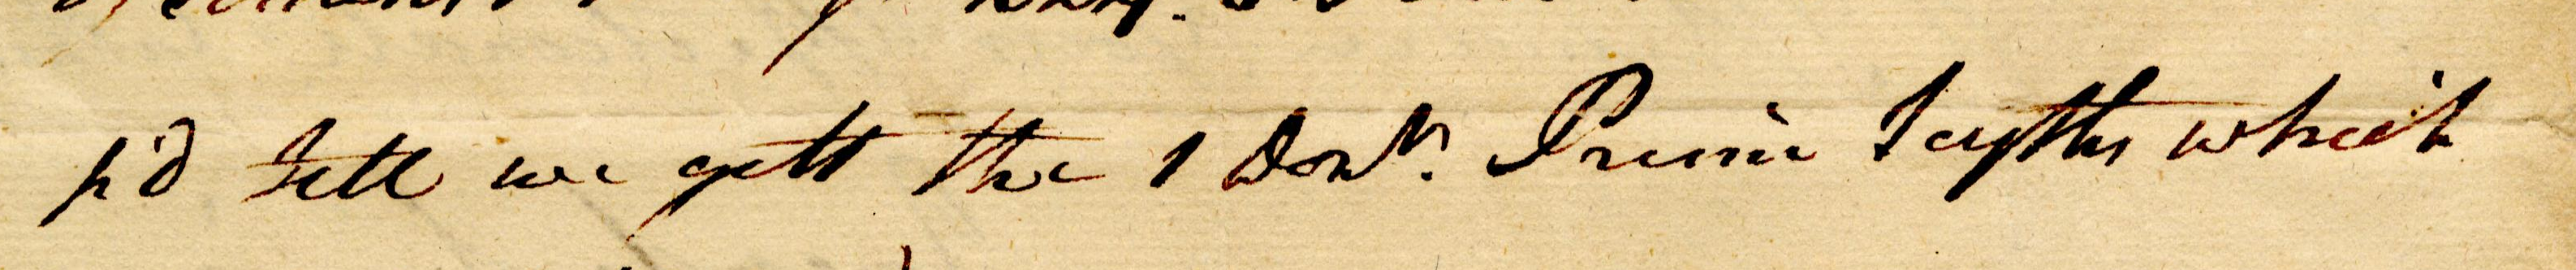h^d tell we gett the 1 Doz^n. Price Scythes which
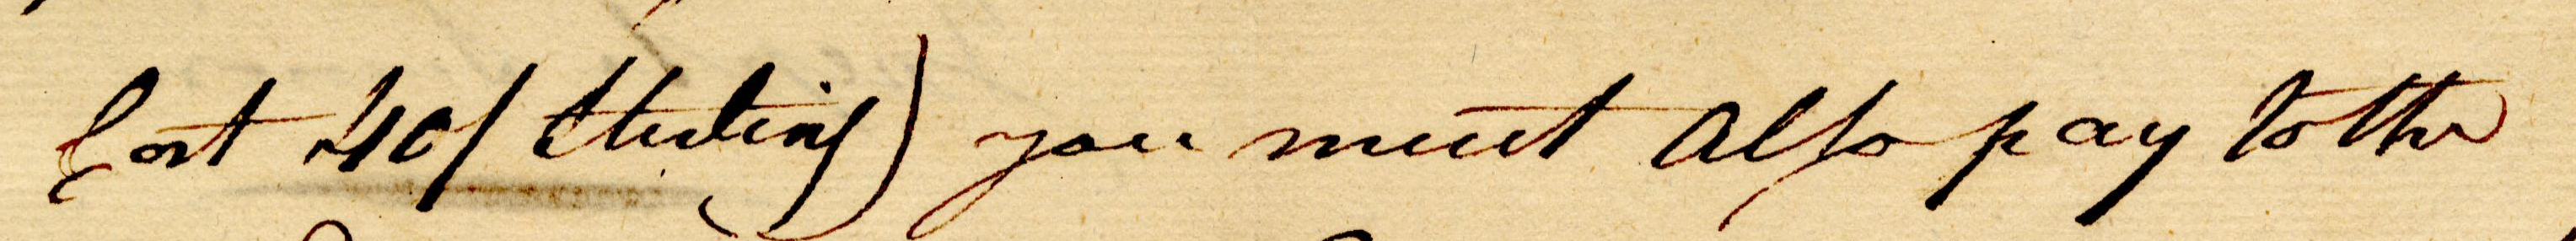Cort 40s Sterling) you must also pay to the
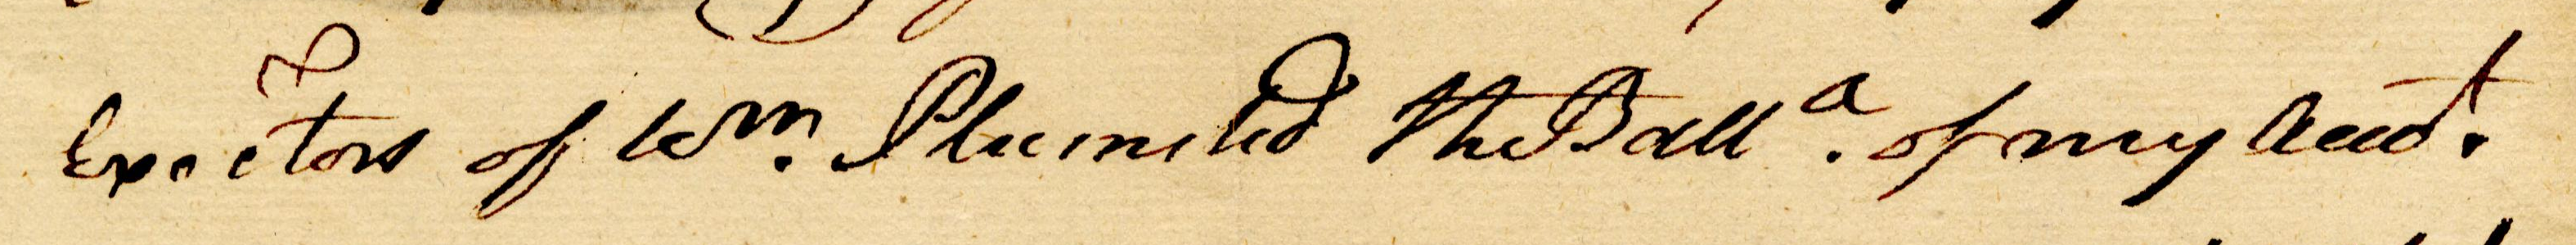exectons of W^m. Placens led the Ball^ce. of my acco^t.
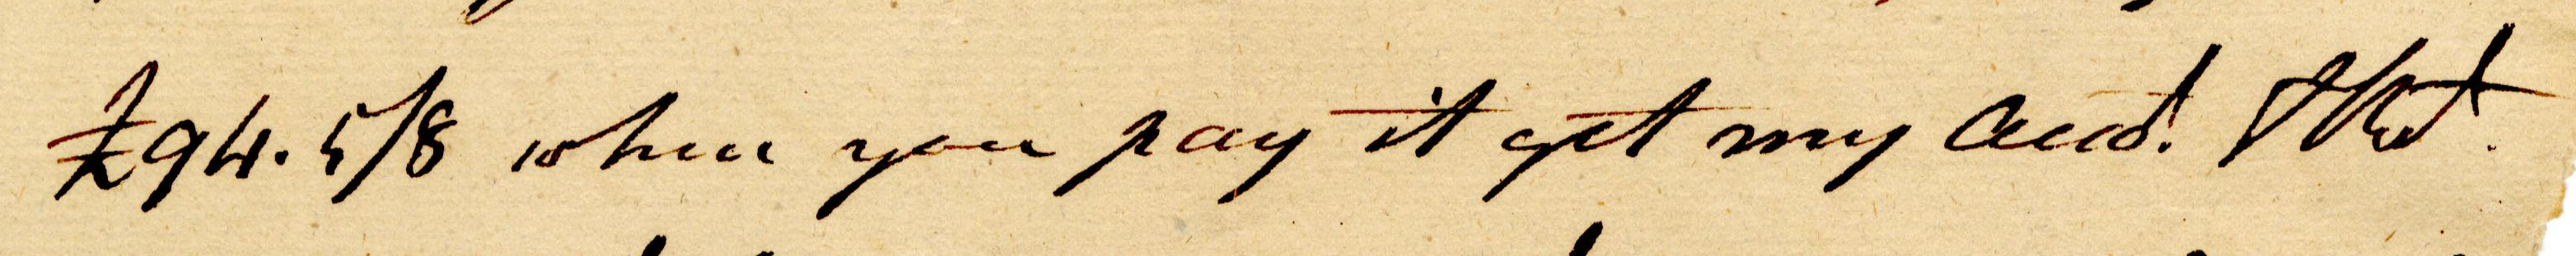£94. 5/6 when you say it get my acco^t. & re^t.
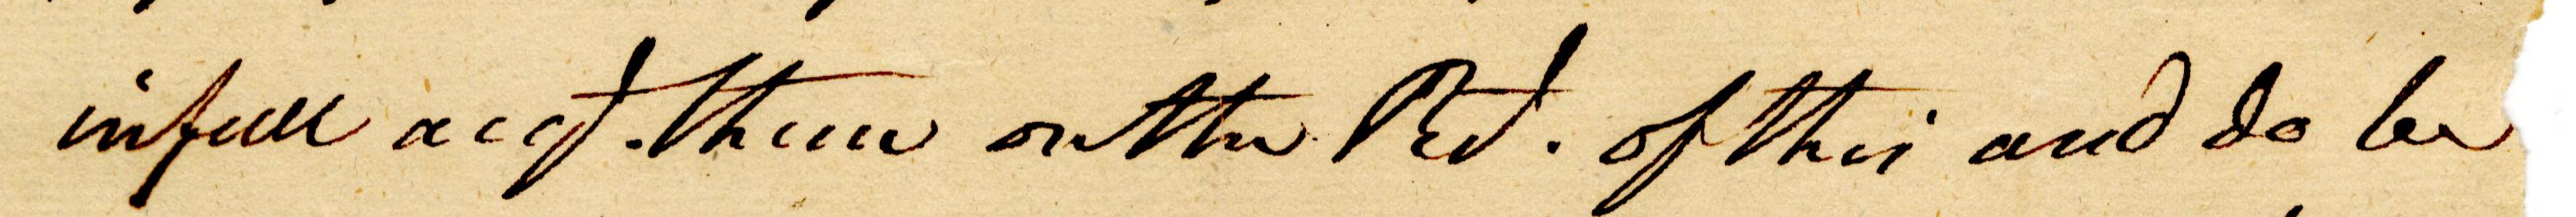in full acco^t. them on the Re^t. of this and do be
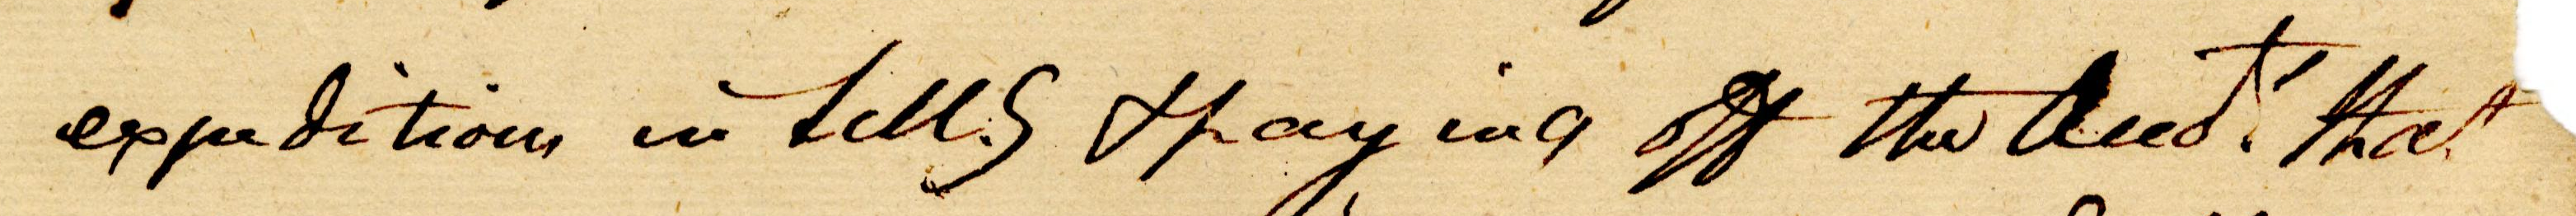expeditious in Sellg. & paying off the Acco^t. that
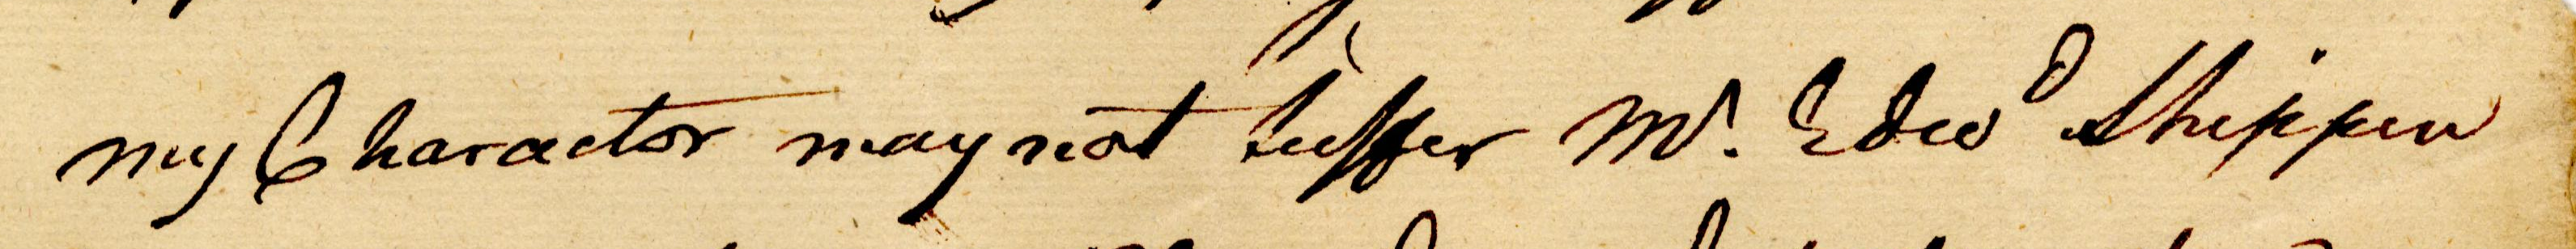my Character may next suffer M^r. Edw^d Shippen
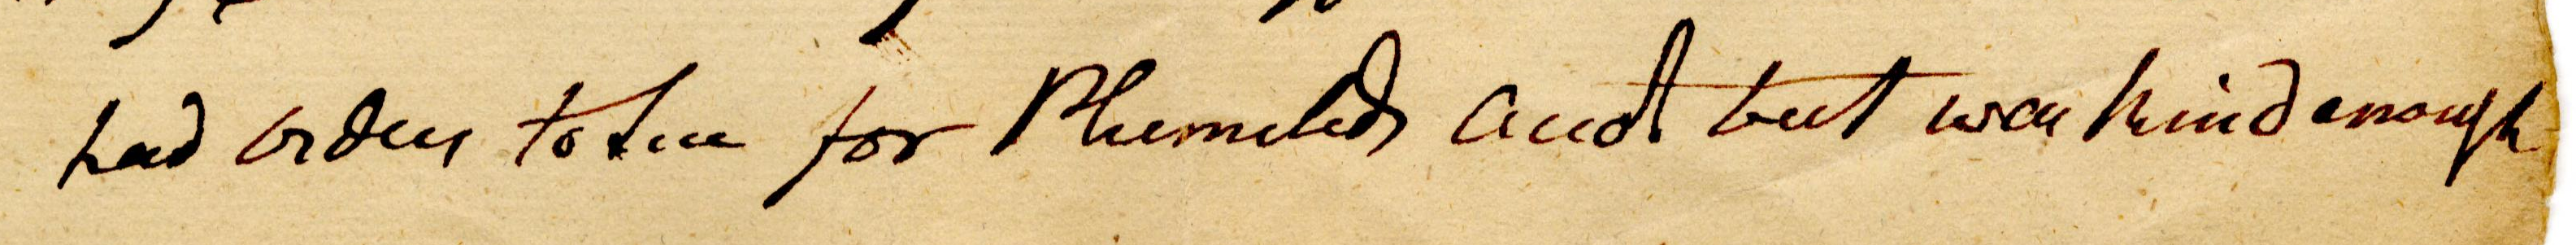had orders to see for Plemeles Acco^t but was kind enough
